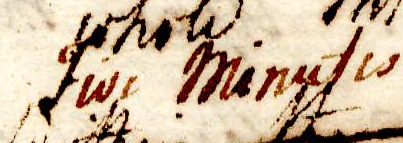Five Minutes
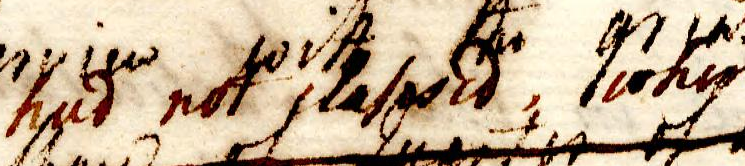had not elapsed when
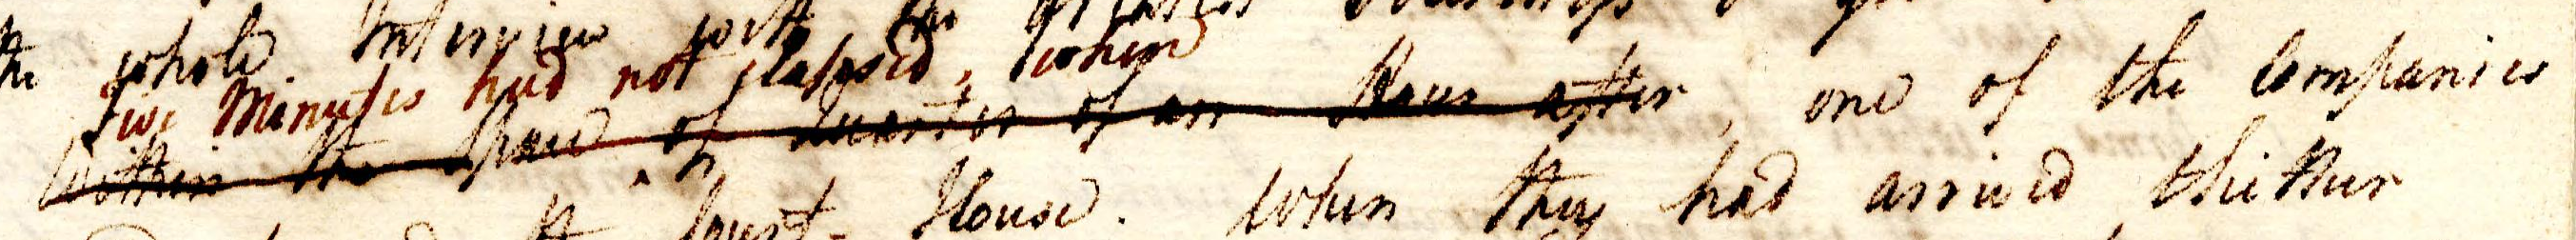[Within the space of quarter of an hour after] one of the Companies
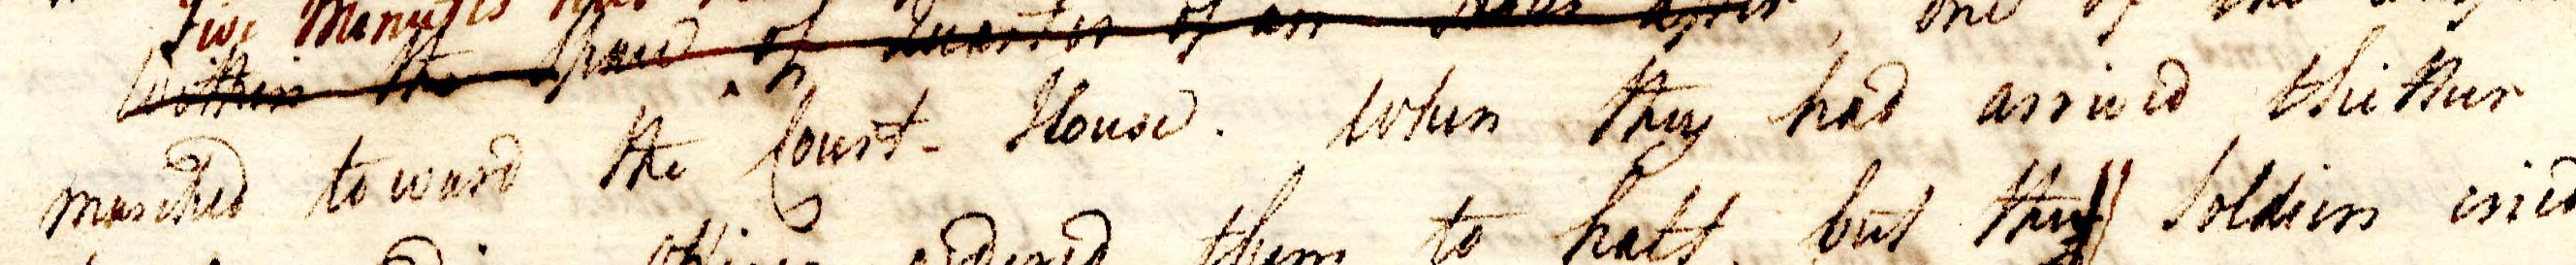marched toward the Court House when they had arrived thither
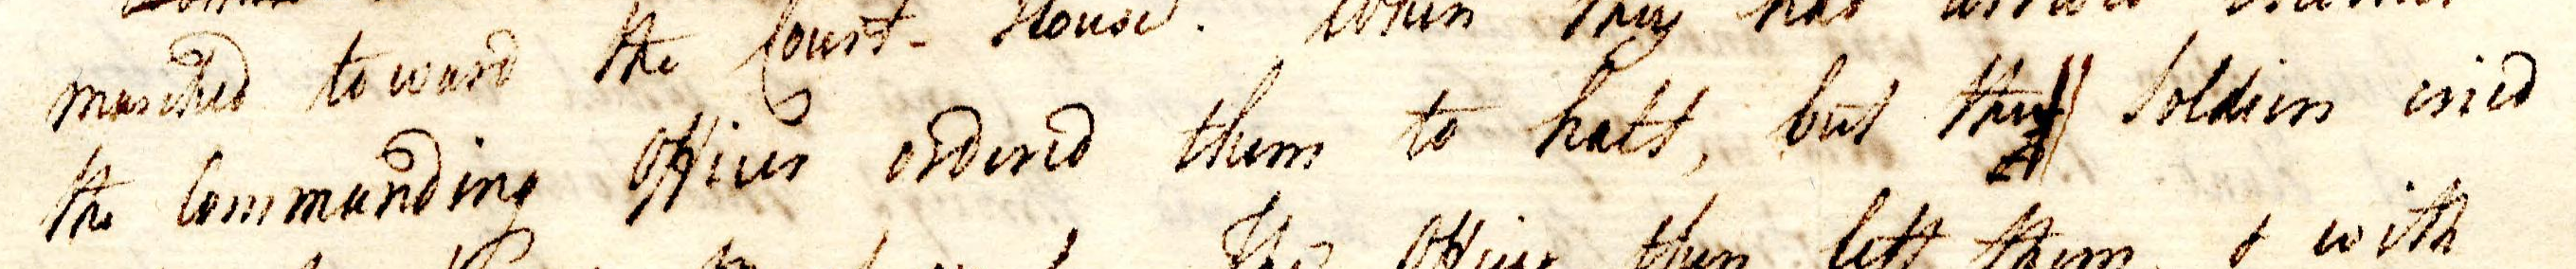the Commanding Officer ordered them to halt, but the Soldiers cried
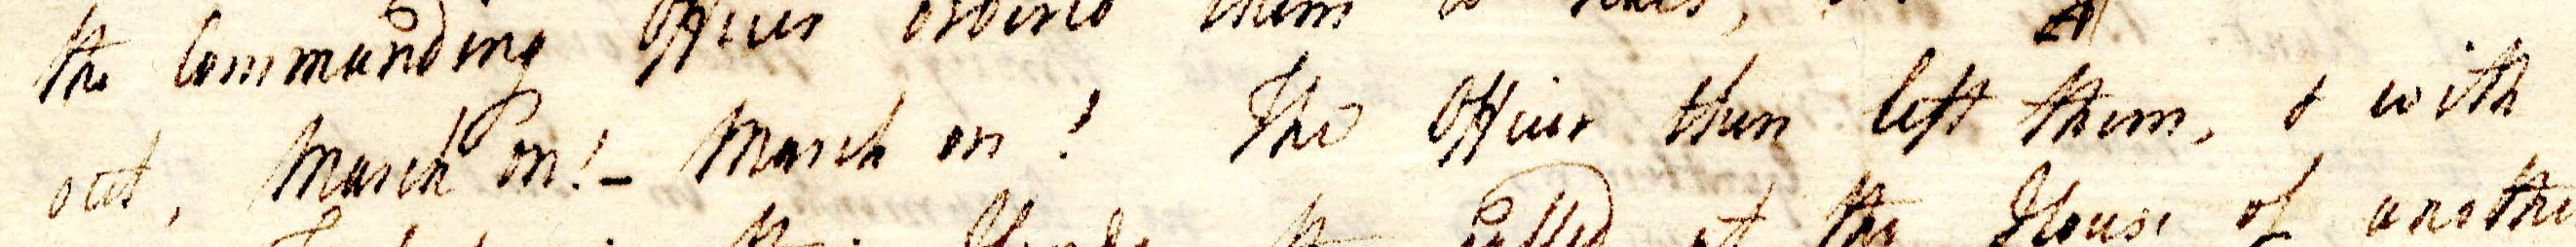out, March on! March on! The Officer then left them, & with
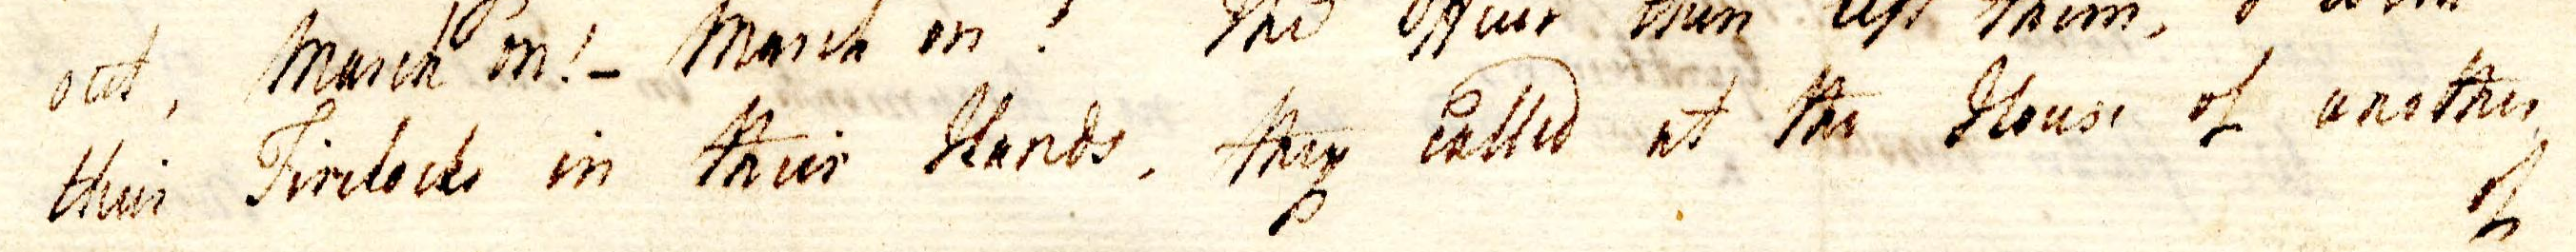their Firelocks in their Hands, thy called at the House of another
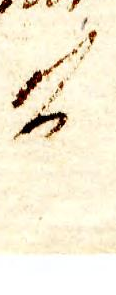of
